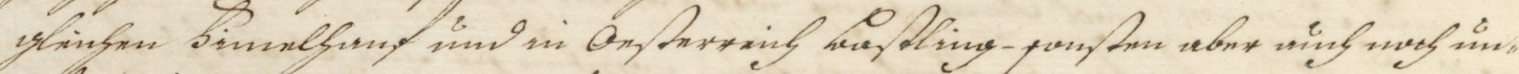gleichen Fimelhanf und in Oesterreich Bastling- sonsten aber auch noch un-
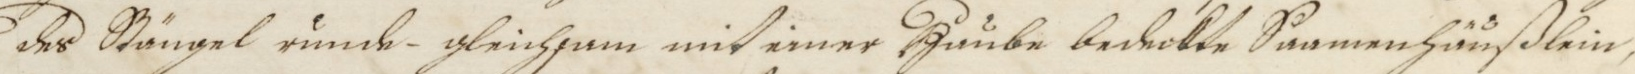des Stängel runde — gleichsam mit einer Haube bedeckte Saamenhäußlein,
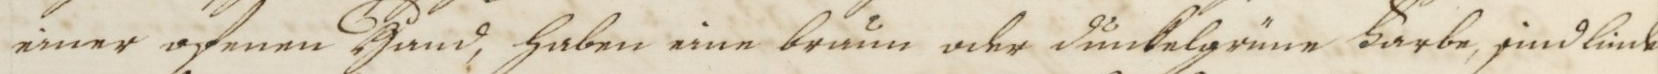einer ofenen Hand, haben eine braun oder dunkelgrüne Farbe, sind linde
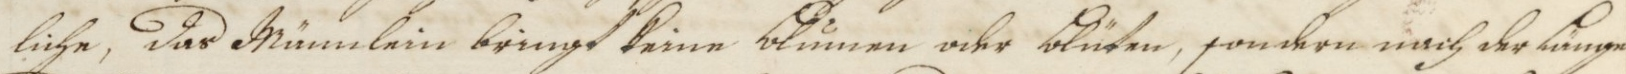liche, das Männlein bringt keine Blumen oder Blüten, sondern nach der Länge
